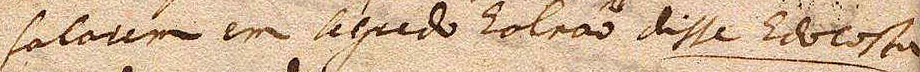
falarem em segredo E al naõ disse E do costu
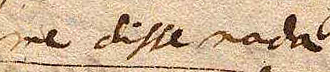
me disse nada
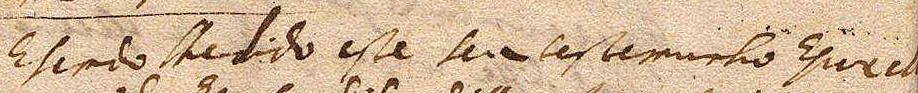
E semdo lhe lido este seu testemunho E por el
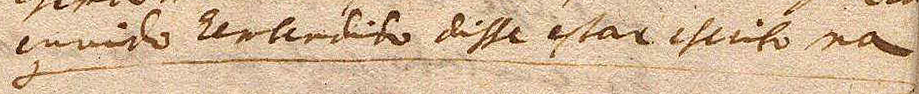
ouuido E emtemdido disse estar escrito na
